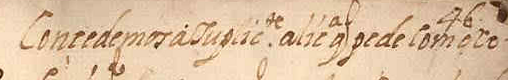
Concedemos a suplic.te a liç.a q̄ pede com o re
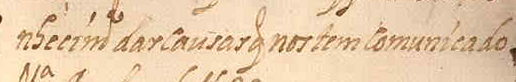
nhecimto das causas q̄ nos tem comunicado
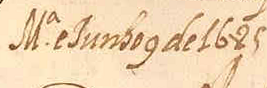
M.a e Iunho 9 de 1685
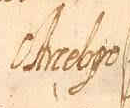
O Arcebpo
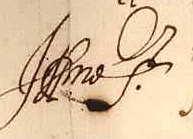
Jllmo S.or
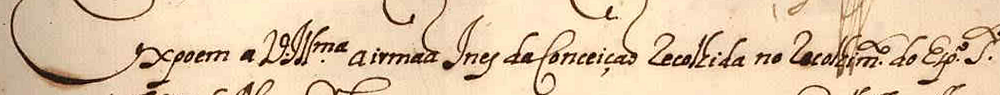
Expoem a V. Ill.ma a irmaā Jnes da Conceiçaõ Recolhida no Recolhim.to do Esp.o S.to
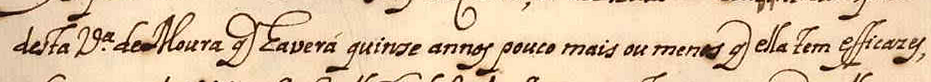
desta V.a de Moura q̄ haverá quinse annos pouco mais ou menos q̄ ella tem efficazes,
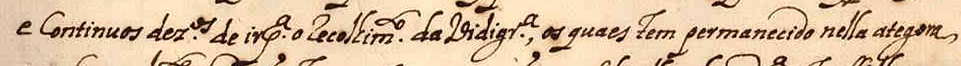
e Continuos dez.os de ir p.a o Recolhim.to da Vidigr.a, os quaes tem permanecido nella ate gora
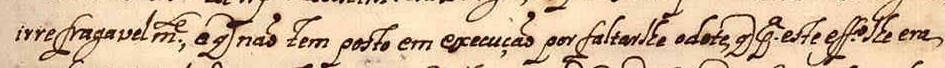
irrefragavelm.te, o q̄ naõ tem posto em execuçaõ por faltar lhe o dote, q̄ p.a este eff.o lhe era
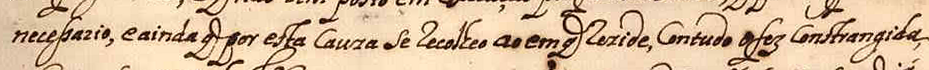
necessario, e ainda q̄ por esta cauza se Recolheo ao em q̄ Rezide, Contudo o fez constrangida,
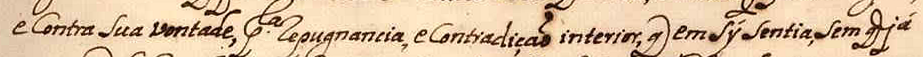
e Contra sua vontade, p̄.la Repugnancia, e Contradiçaõ interior, q̄ em sy sentia, sem q̄ já
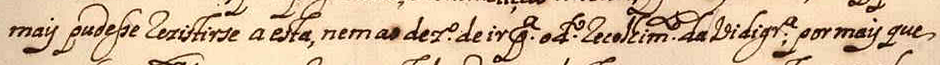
mais pudesse Rezistirse a esta, nem ao dez.o de ir p.a o d̄.o Recolhim.to da Vidigr.a por mais que
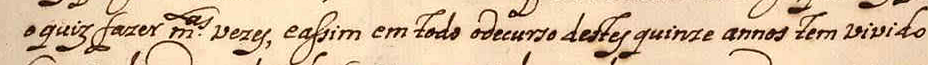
o quiz fazer m.tas vezes, e assim em todo o decurso destes quinze annos tem vivido
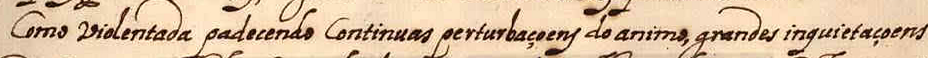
Como violentada padecendo Continuas perturbaçoens do animo, grandes inquietaçoens
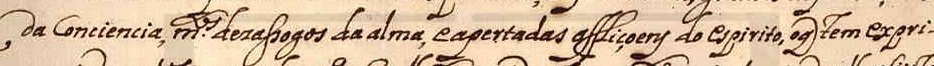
da Conciencia, m.tos dezassogos da alma, e apertadas affliçoens do espirito, o q̄ tem expri
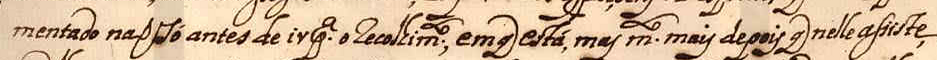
mentado naõ só antes de ir p.a o Recolhim.to, em q̄ está, mas m.to mais depois q̄ nelle assiste,
